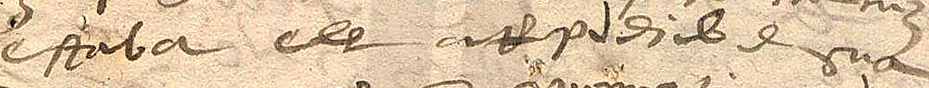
estava elle aRepēdido de sua
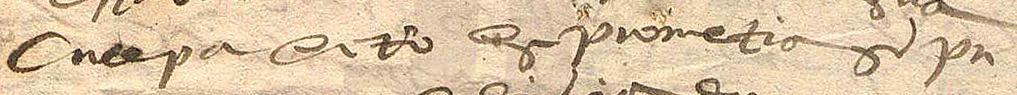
Cullpa e eRo e se prometia sēpre
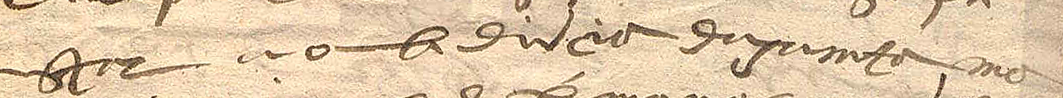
estar a obediēcia da samta ma
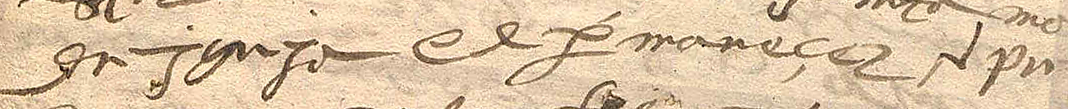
dre JgreJa e de ꝑmanecer sēpre
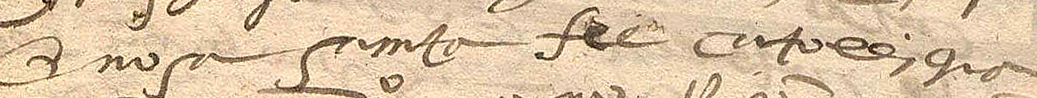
ē nosa samta fee catolljqua
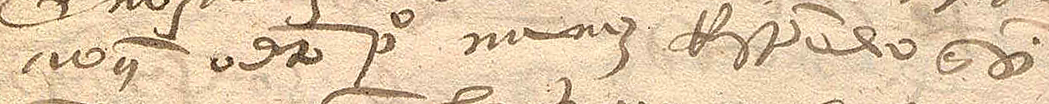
ao q̄ o dito po nunez Respōdeo q̄ sī
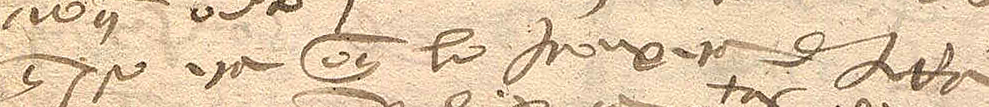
q̄ jso era o q̄ ho trouxera de teRa
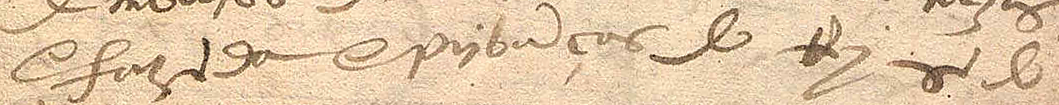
e fazēda e privāças do Rej sēdo
